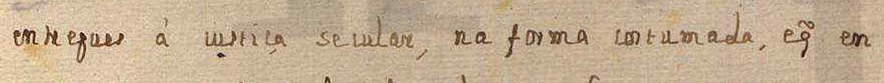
entregues à iustiça secular, na forma costumada, e q̄ en
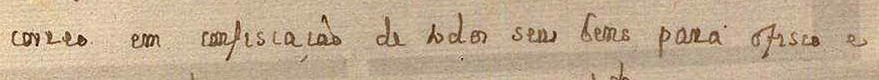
correo em confiscação de todos seus bens para o fisco e
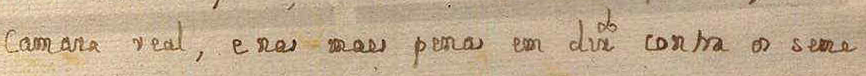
Camara real, e nas maes penas em dirto contra os seme
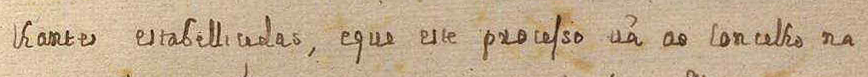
lhantes estabellicidas, e que este processo uá ao Concelho na
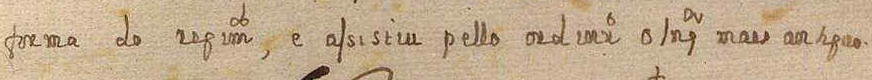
forma do regimto, e assistiu pello ordinro o Inqor maes antiguo
